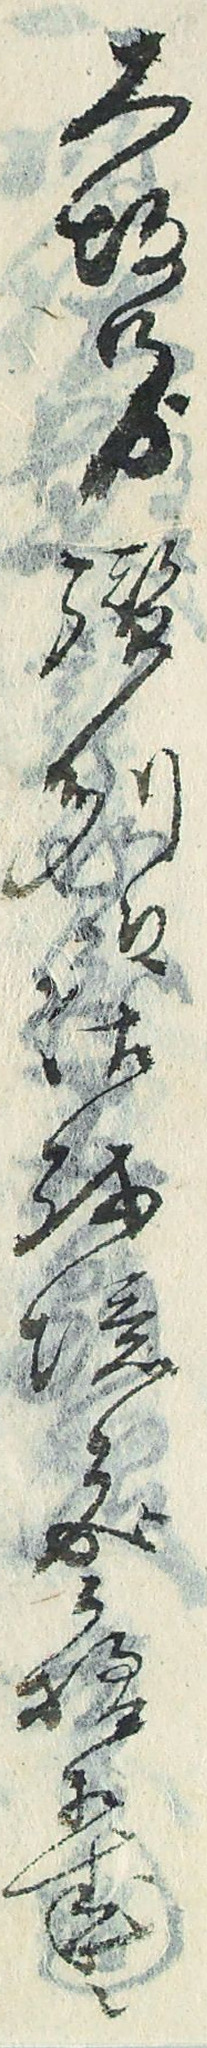大坂口ゟ讃州え御越境被成候様相成候
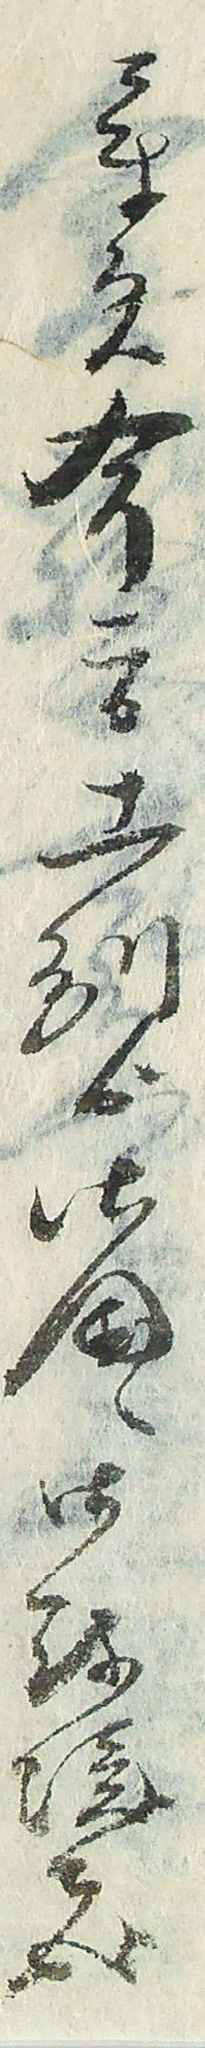に付ては今二日土州ゟ御国へ御越境被成
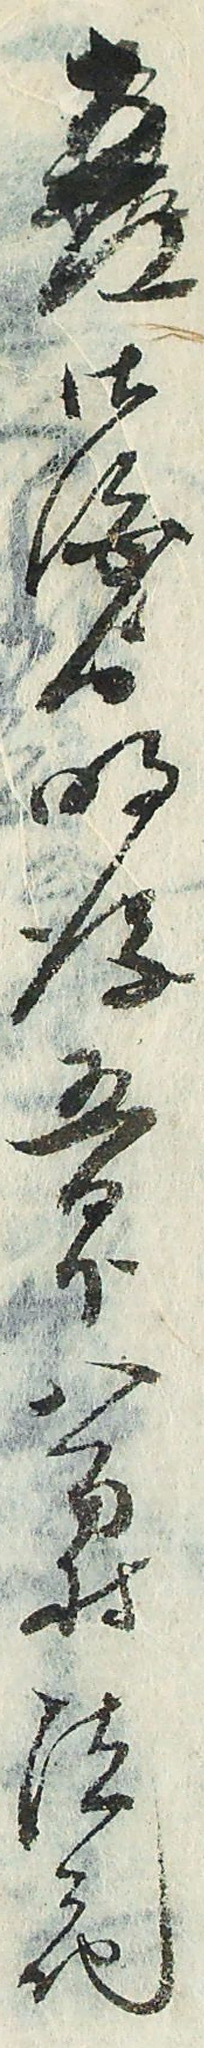立江御泊ゟ明後五日下八万村法花
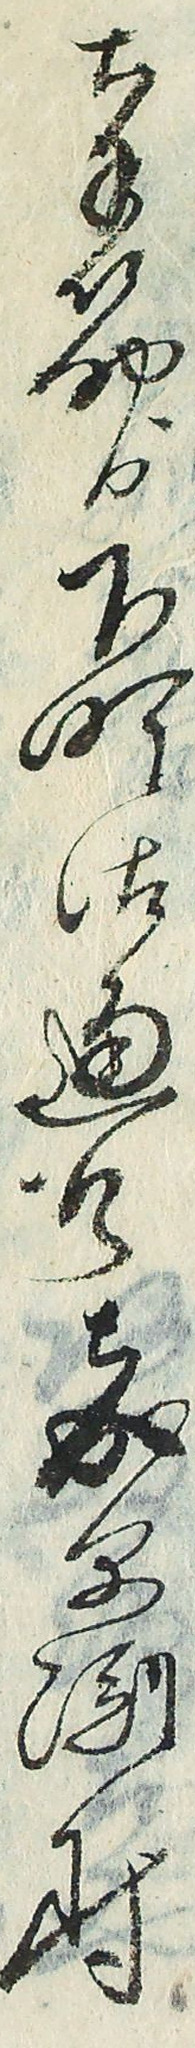土手筋ゟ下町御通行被成早淵村
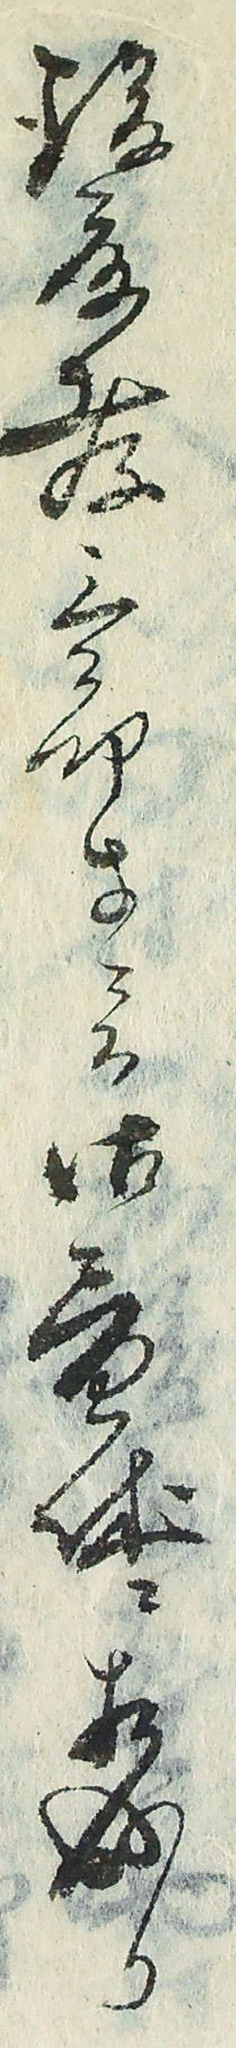後藤孝三郎方にて御昼休に相成り
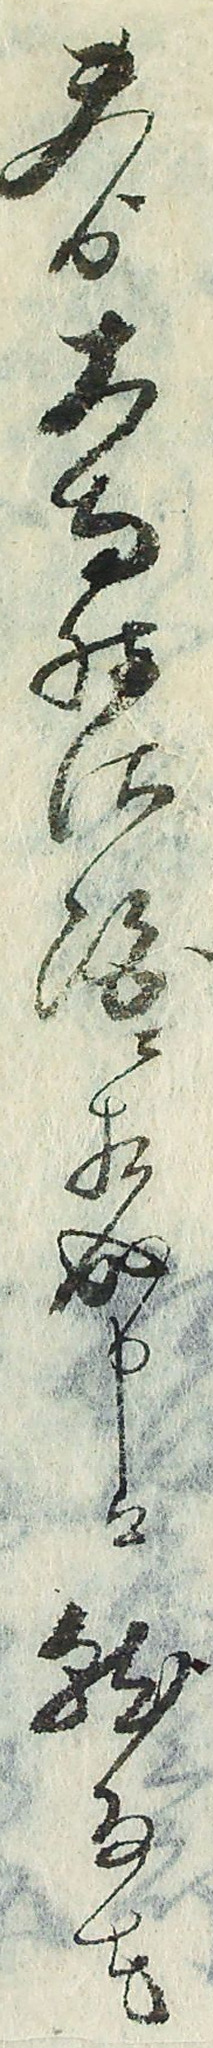夫ゟ大寺村御泊に相成申候就ては
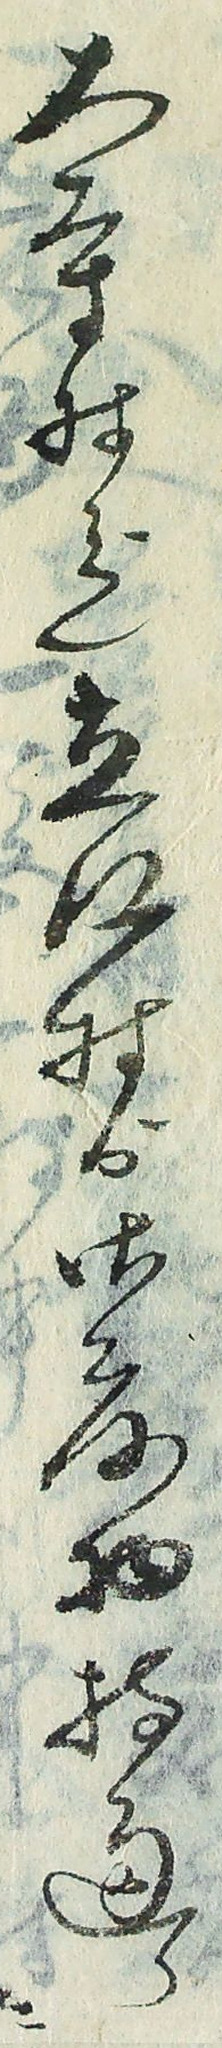大寺村迄立江村ゟ御荷物持通り
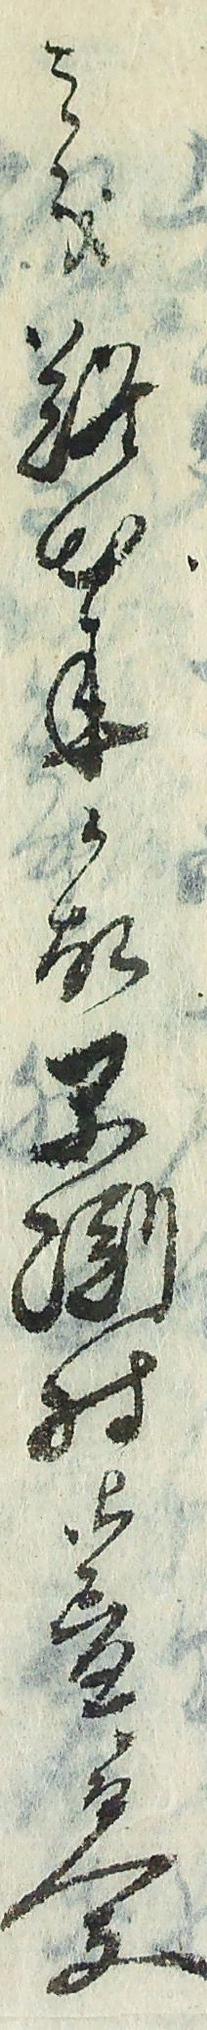之義難出来候故早淵村御昼にて人夫
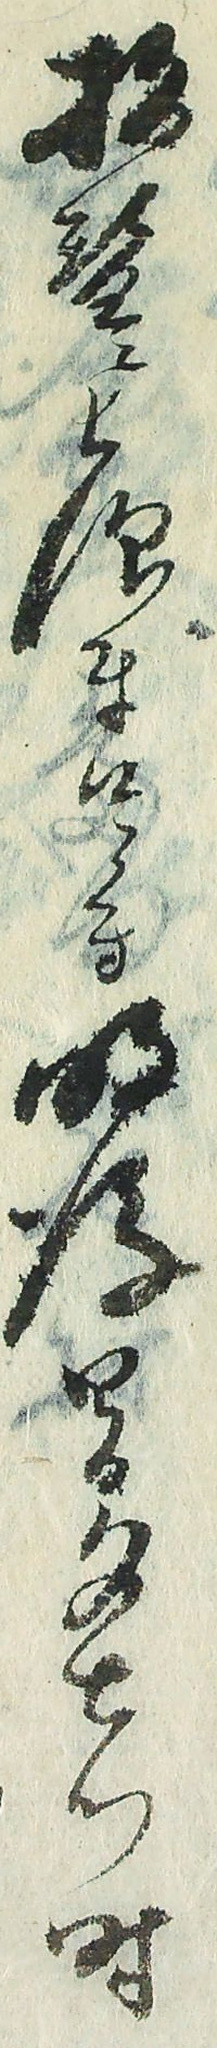指替に被仰付候に付明後四日夕七つ時
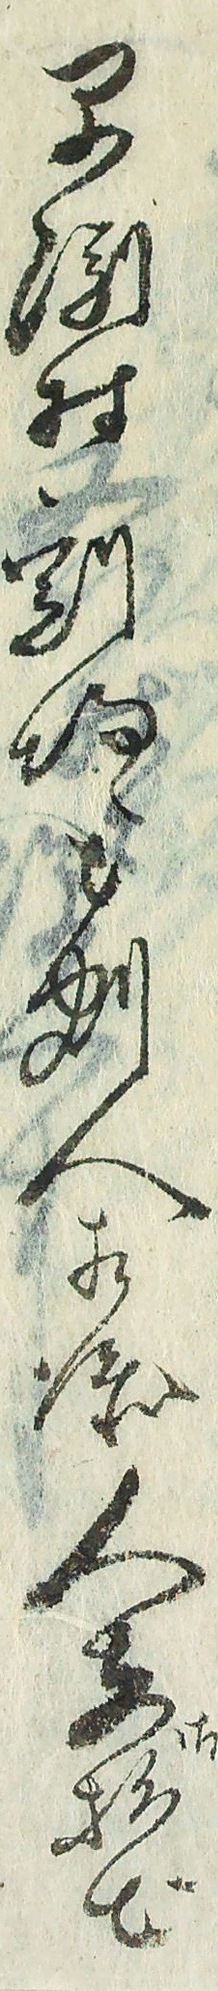早淵村割場へ才判人相添人夫御指出
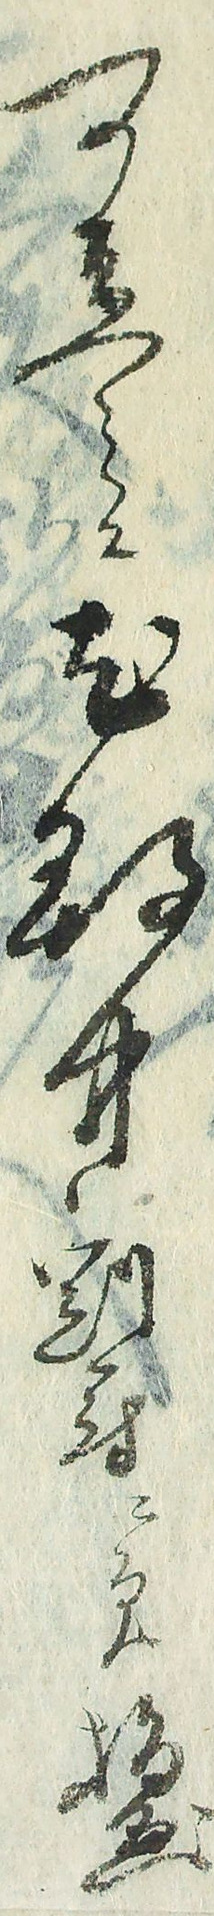可有之候尤郡中割符にては指懸
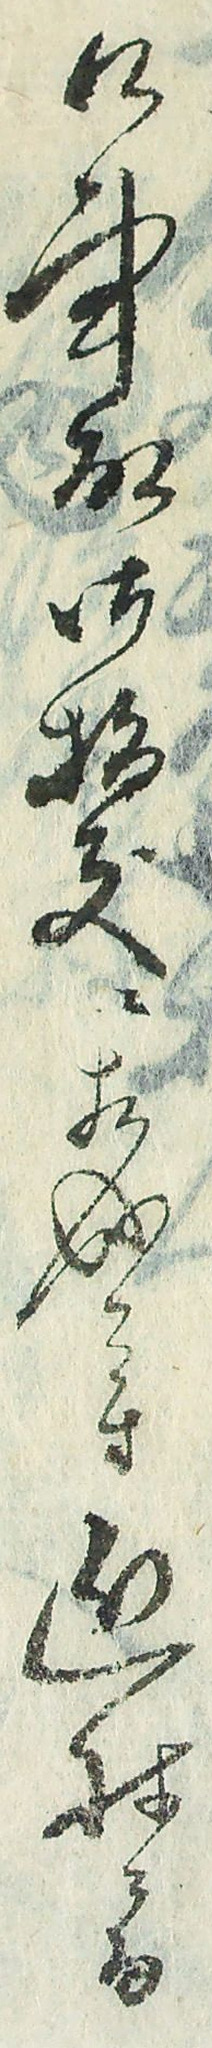候事故御指支に相成候付近村にて
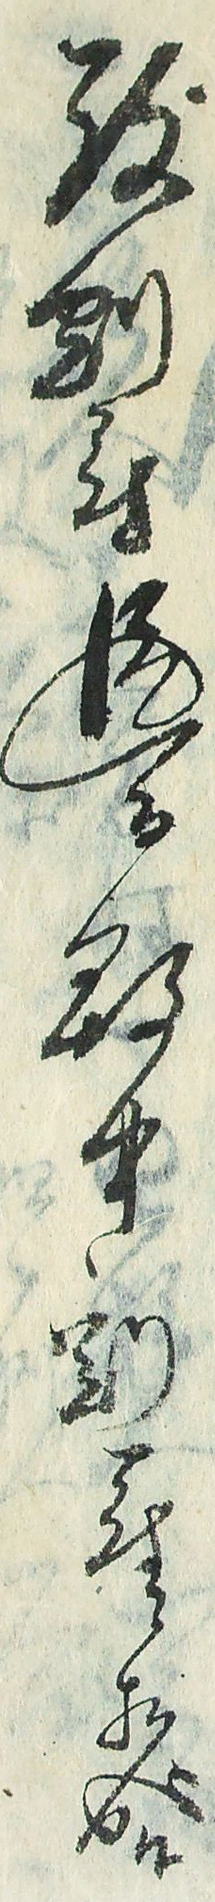致割符追て郡中割符に相成候

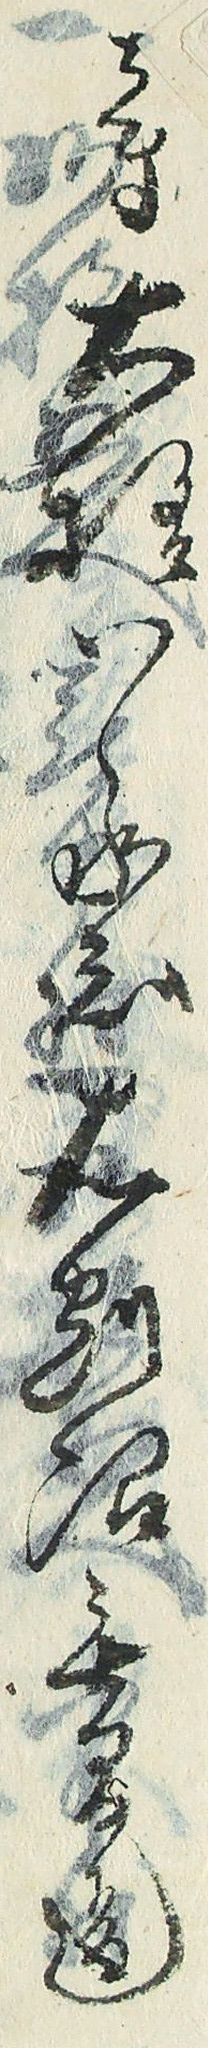に付右様御承知右刻限無間違
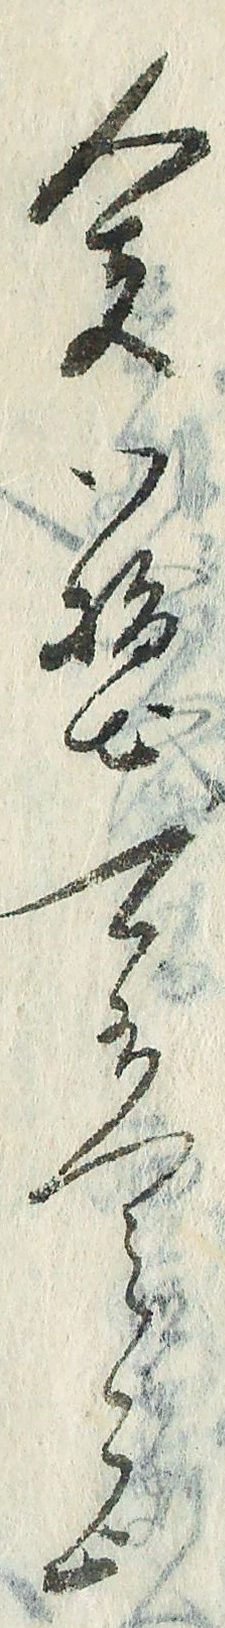人夫御指出可有之候以上
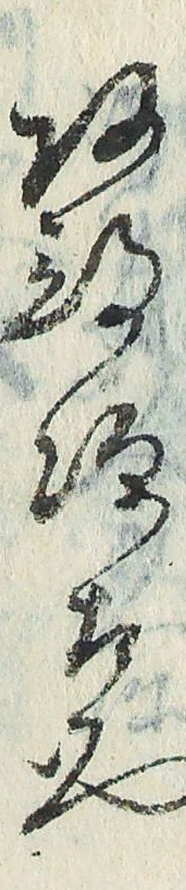阿部次左衛門
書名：公辺御役人為御廻浦御立越諸御用一巻
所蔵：鳴門教育大学 Naruto University of Education
